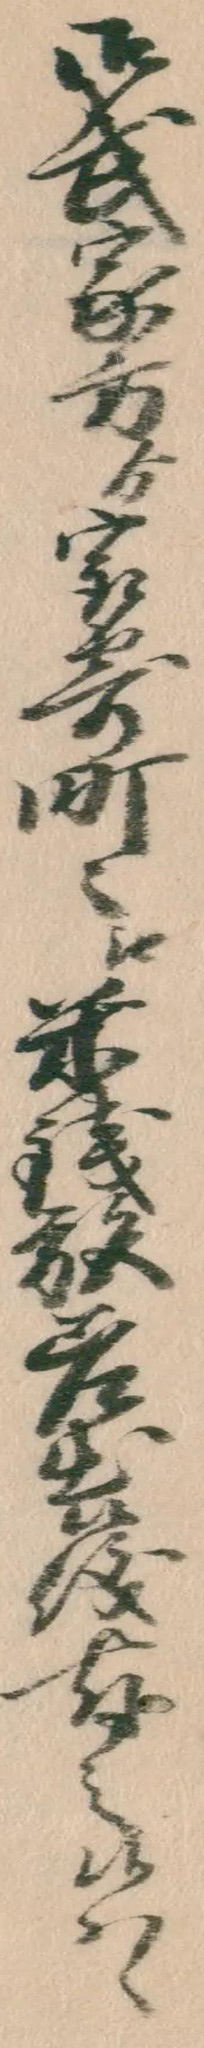御武家方ゟ最寄町々え米銭施差出候儀有之候ハヽ
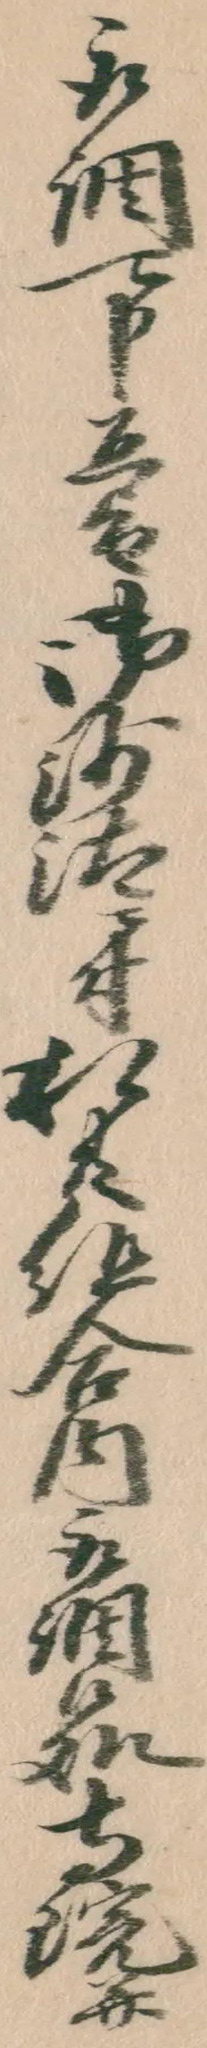取調可申立旨御沙汰ニ付私共組合内取調候処寺院并
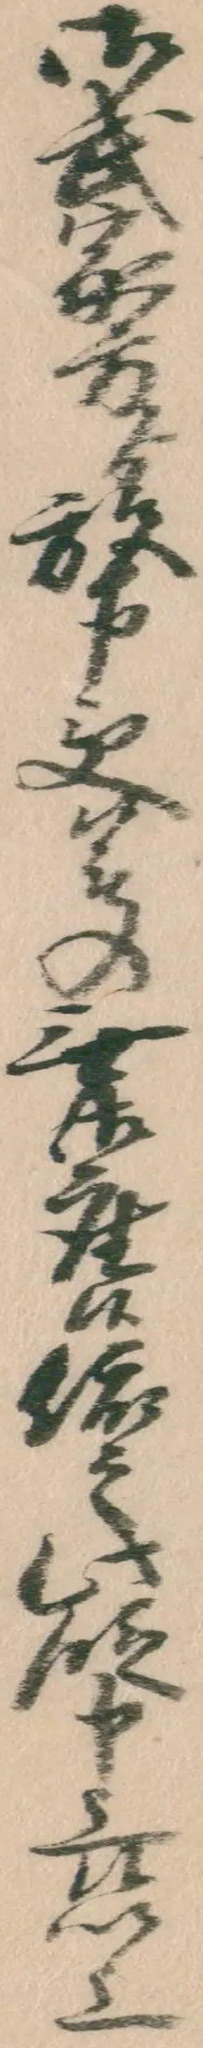御武家方ゟ施申受候もの無御座候依之此段申上候以上

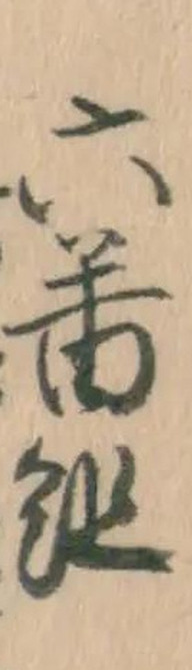六番組
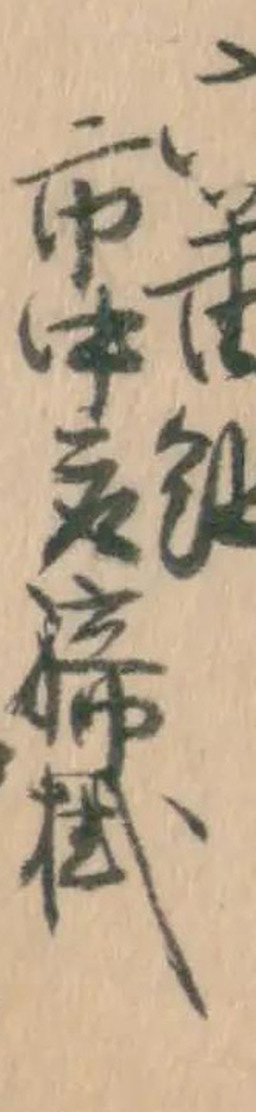市中取締掛

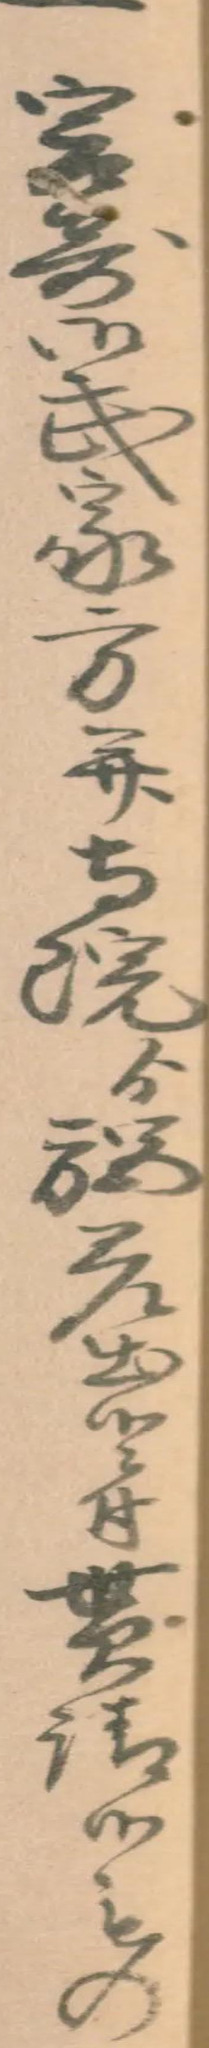一最寄御武家方并寺院ゟ施差出候ニ付貰請候もの
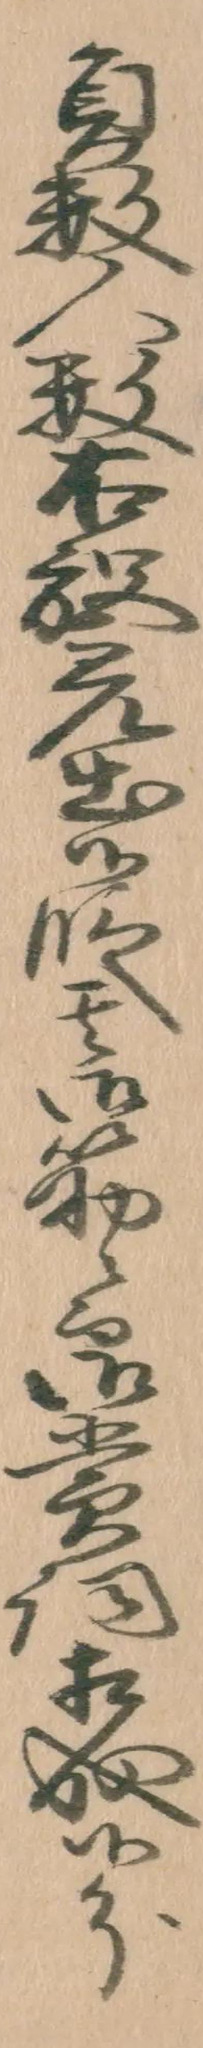員数人数右施差出候段其御筋ニ而御賞伺相成候分
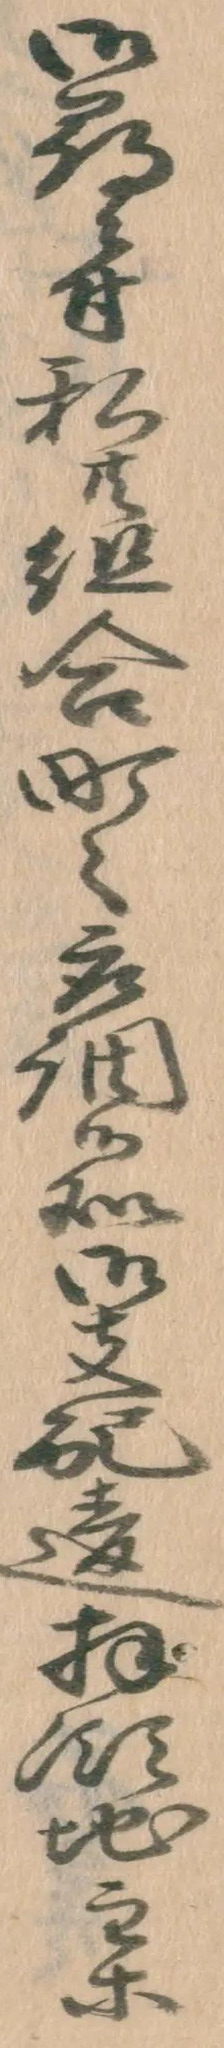御尋ニ付私共組合町々取調候処御支配違拝領地主等
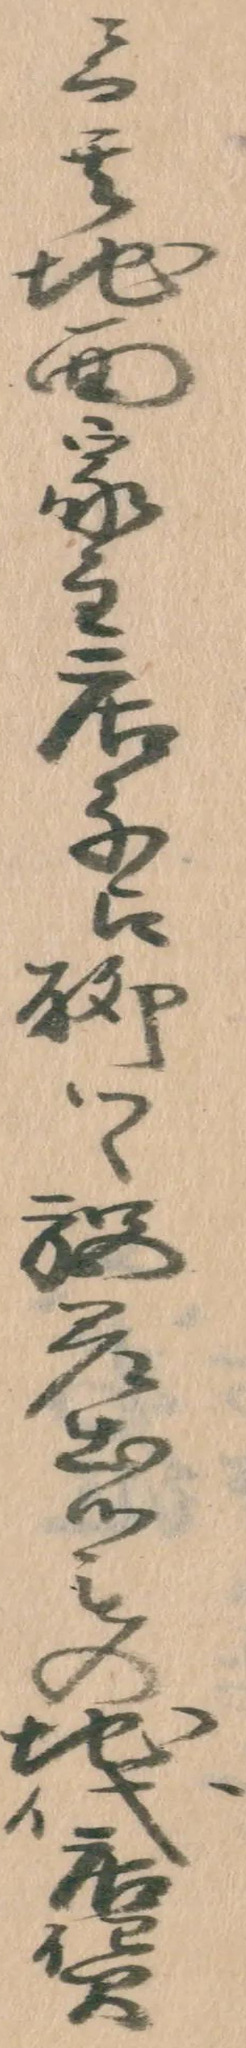ニ而其地面家主店子え聊ツヽ施差出候もの地代店賃
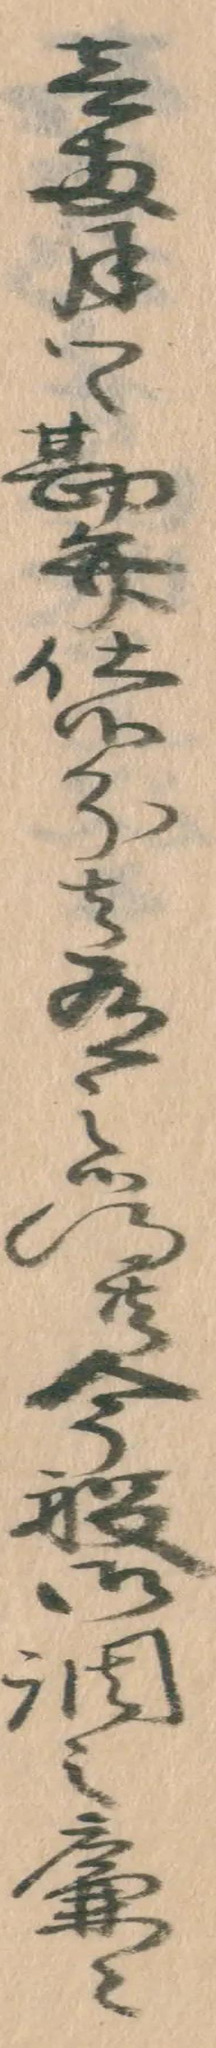壱両月ツヽ勘弁仕候分は有之候得共今般御調之廉々
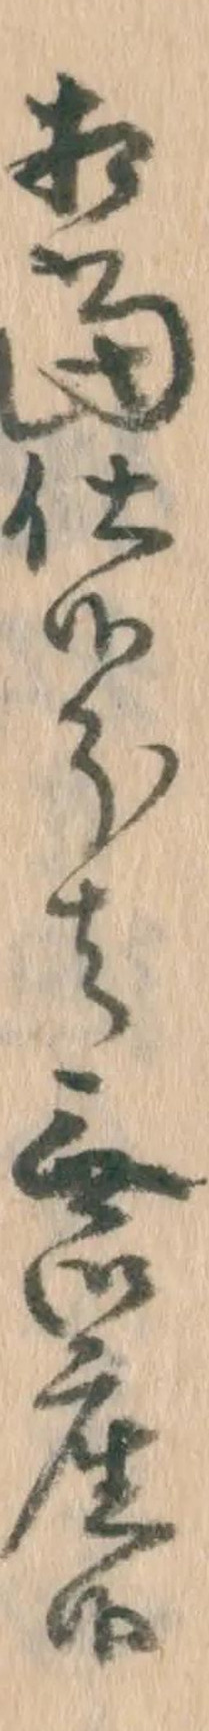相当仕候分は無御座候

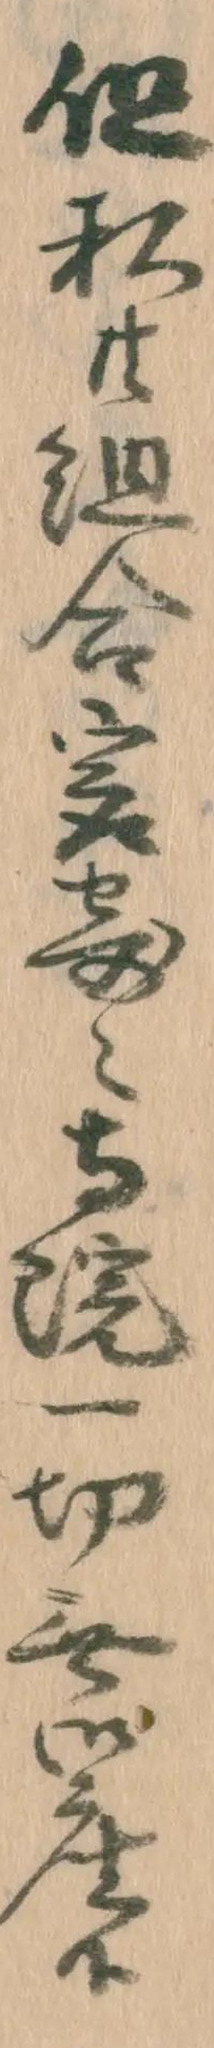但私共組合最寄之寺院一切無御座候
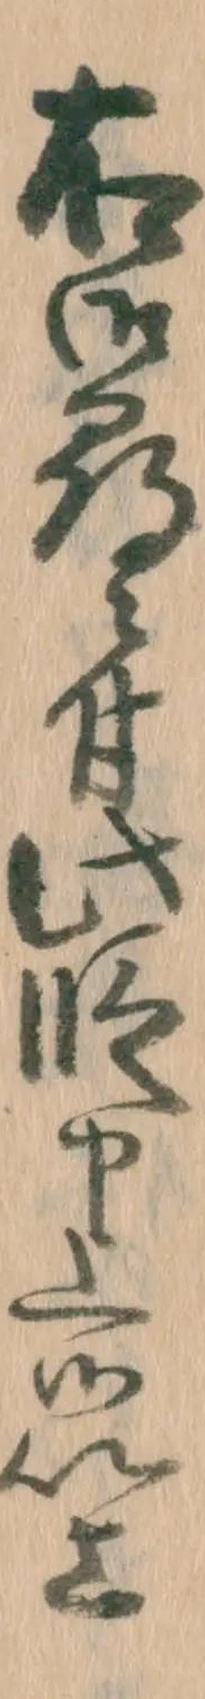右御尋ニ付此段申上候以上
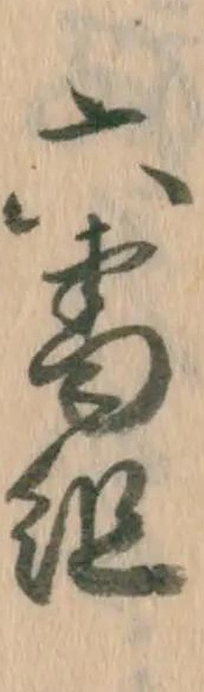六番組
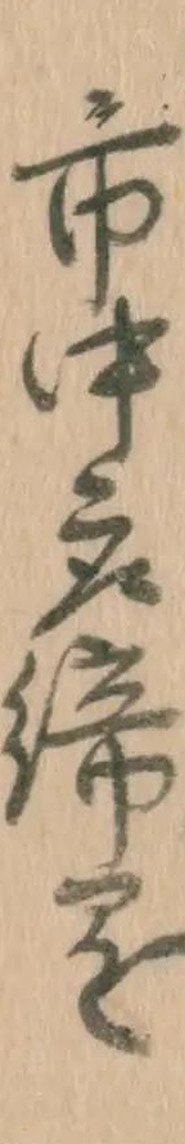市中取締懸
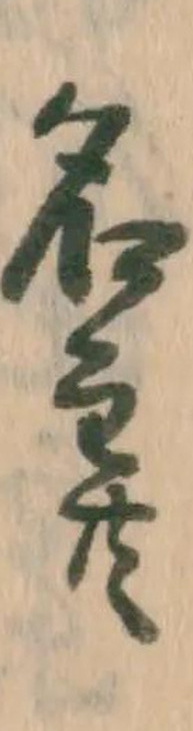名主共
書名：武家方并寺院等ニテ施差出候一件
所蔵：国立国会図書館 National Diet Library, JAPAN
